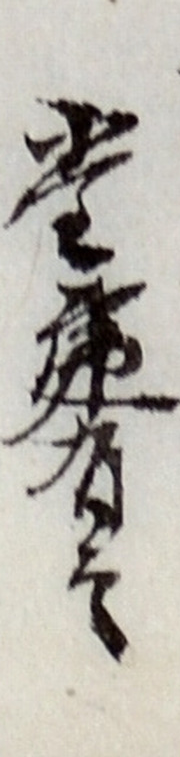堂建有之
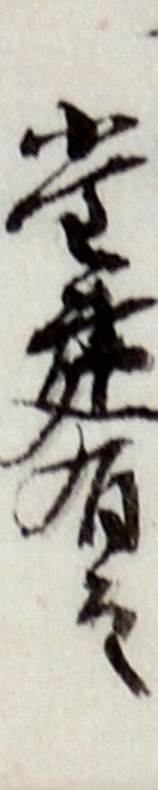堂建有之
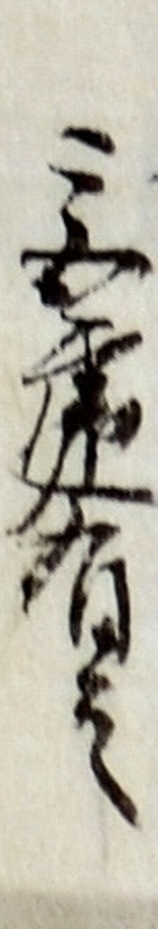宮建有之
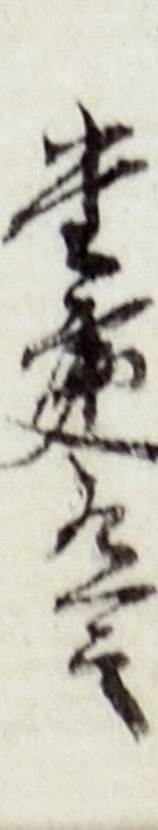宮建有之
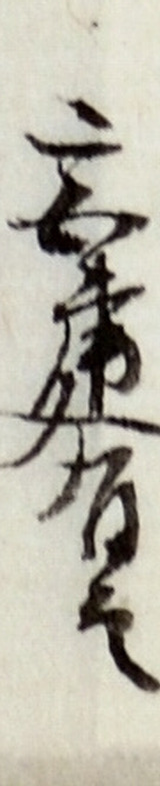宮建有之
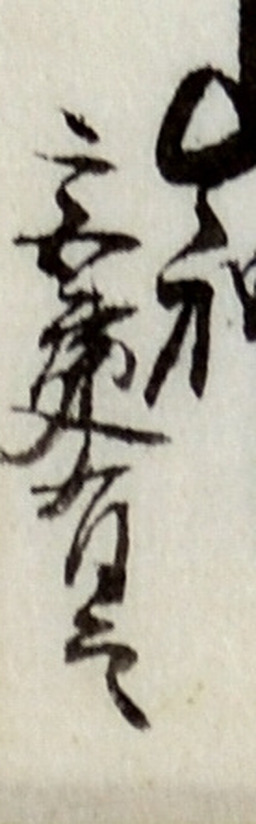宮建有之
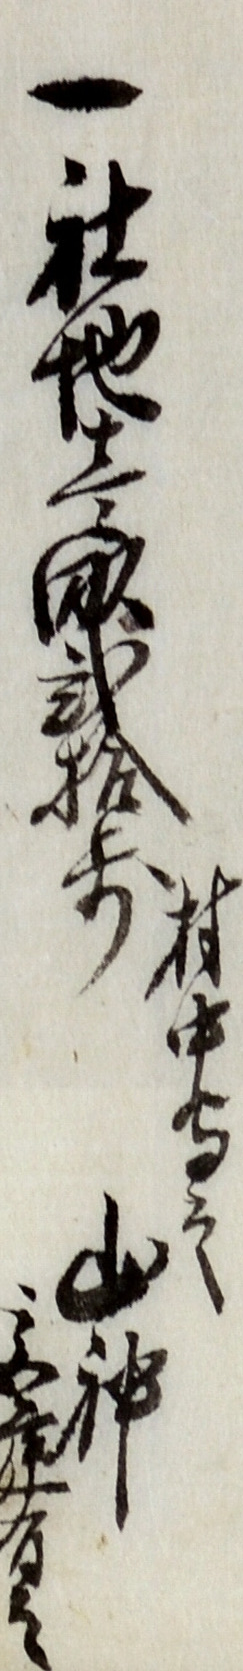一社地壱畝弐拾歩山神
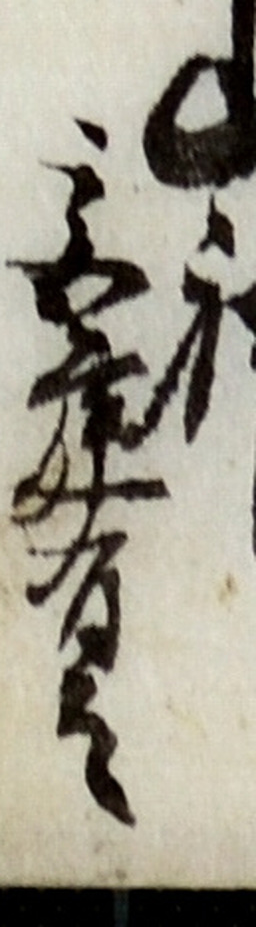宮建有之
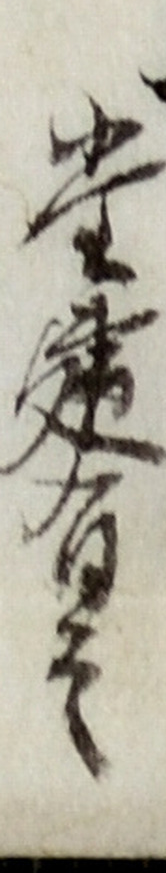堂建有之

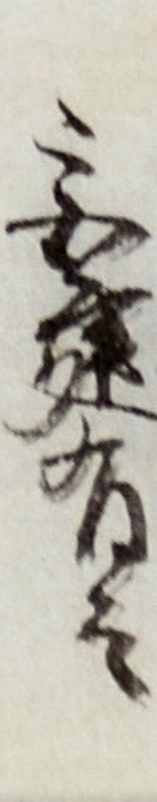宮建有之
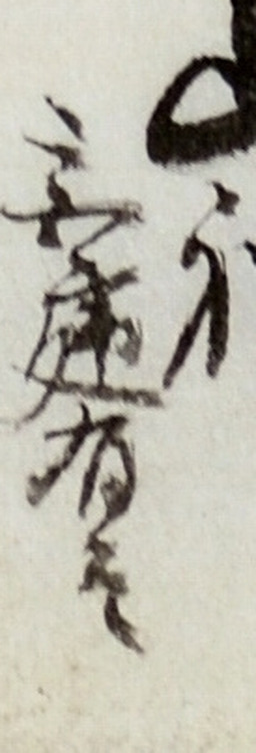宮建有之
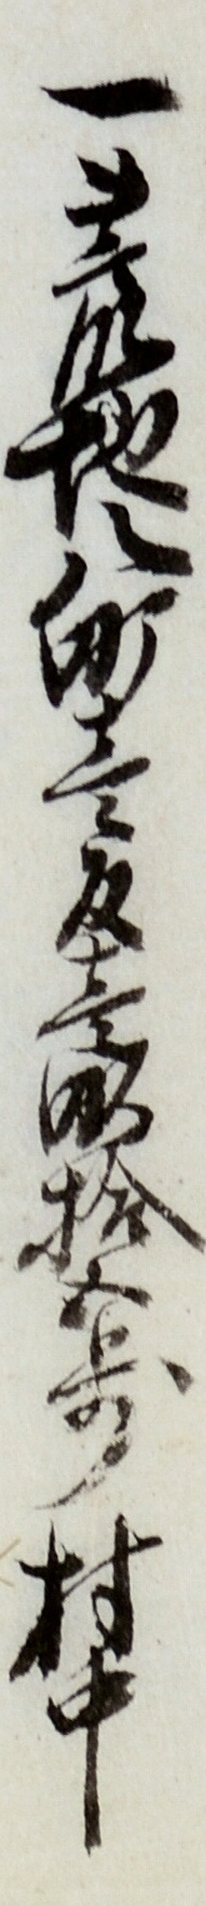一荒地八町壱反壱畝拾五歩村中
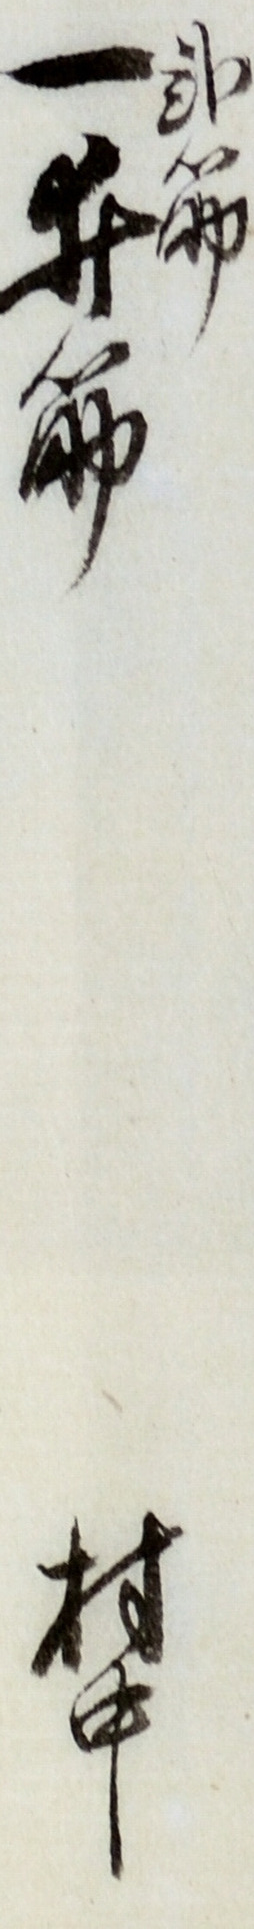一井筋村中
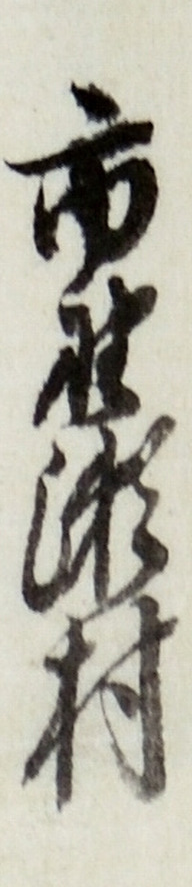市野瀬村
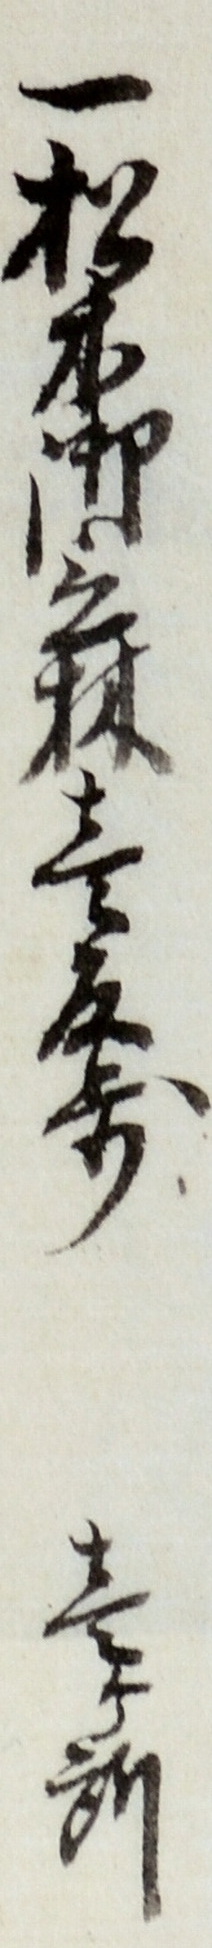一松木御立林壱反歩壱ヶ所
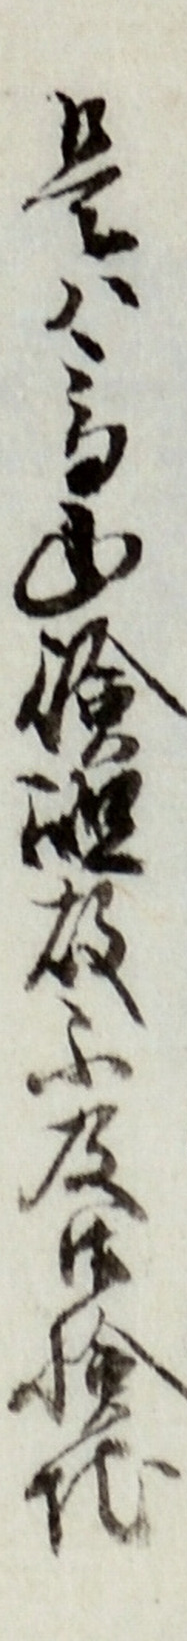是ハ高山嶮岨故不及御検地
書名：御領分中山林社地手控
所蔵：伊那市立高遠町図書館・合同会社AMANE
